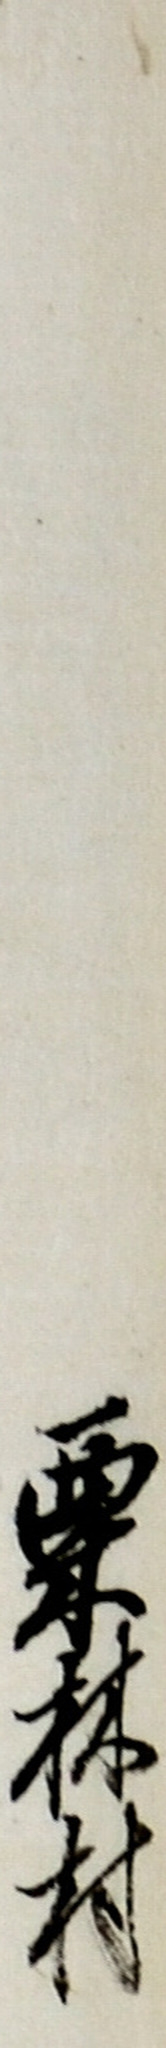栗林村
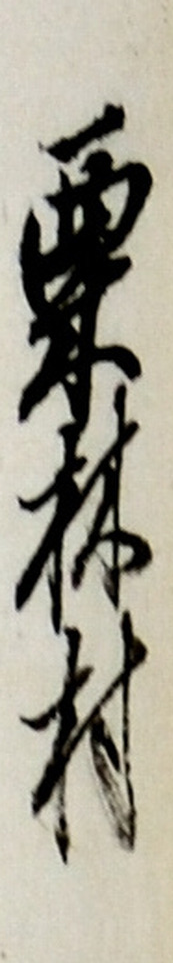栗林村
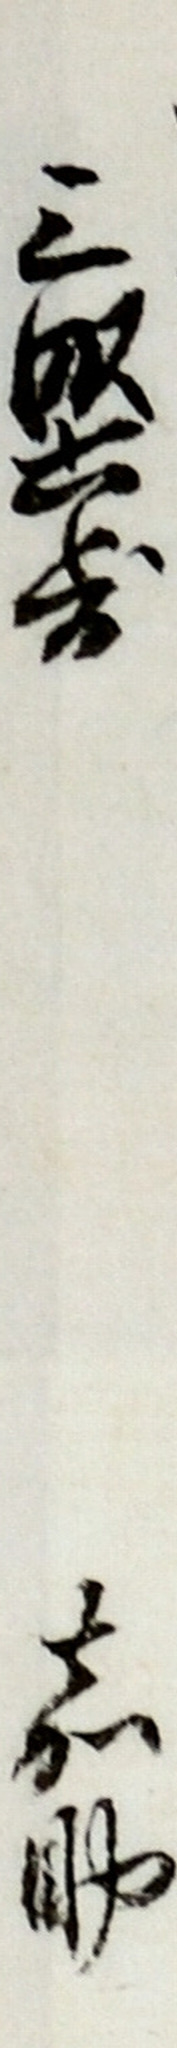三畝六歩嘉助
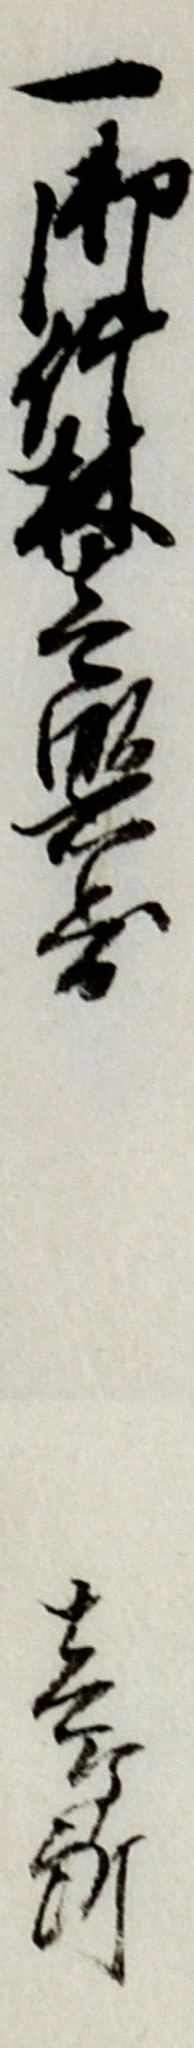一御竹林壱畝六歩壱ケ所
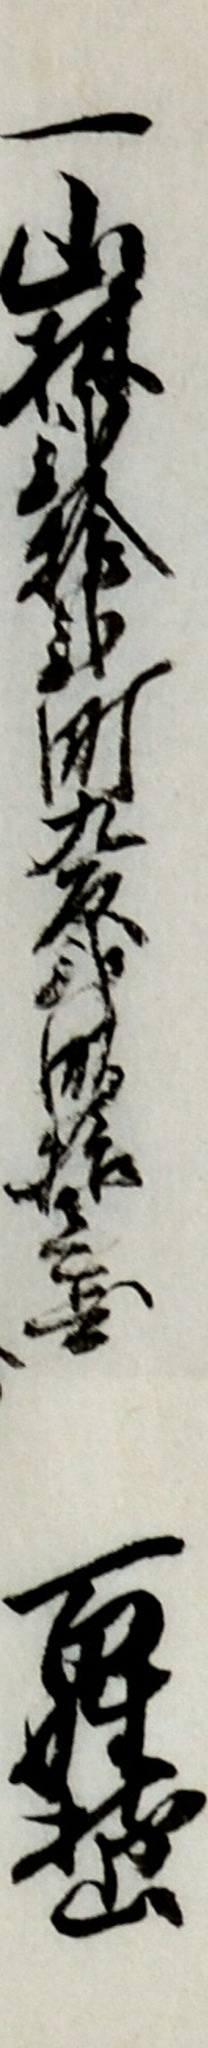一山林弐拾弐町九反弐畝拾壱歩百姓持山
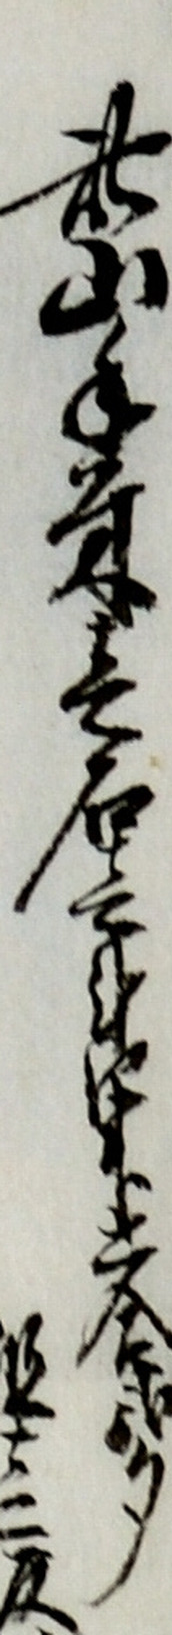此山手米壱石壱斗四升六合弐勺

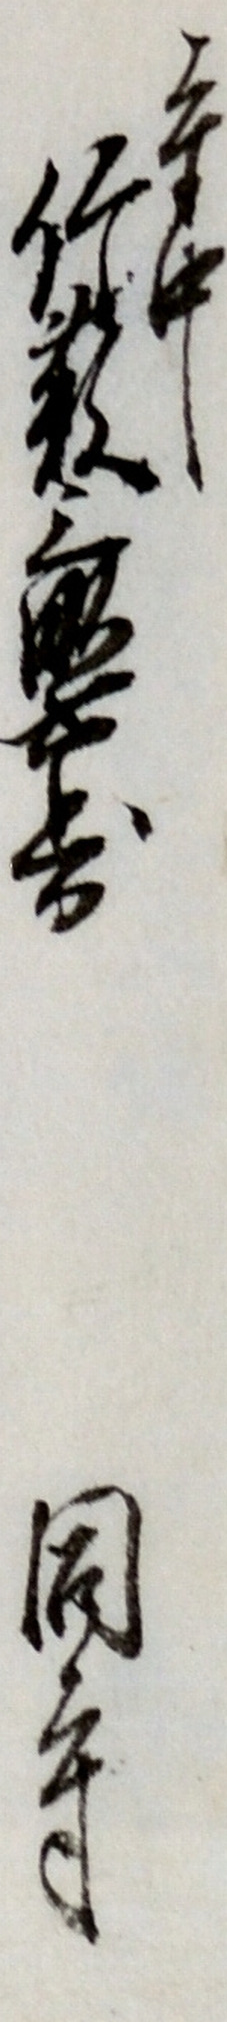竹藪三畝六歩同寺
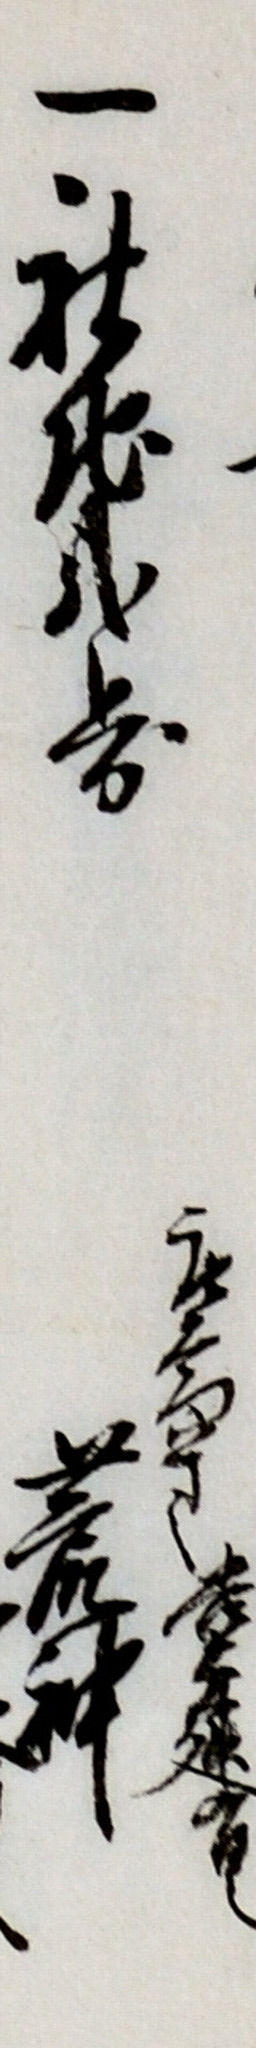一社地弐歩荒神
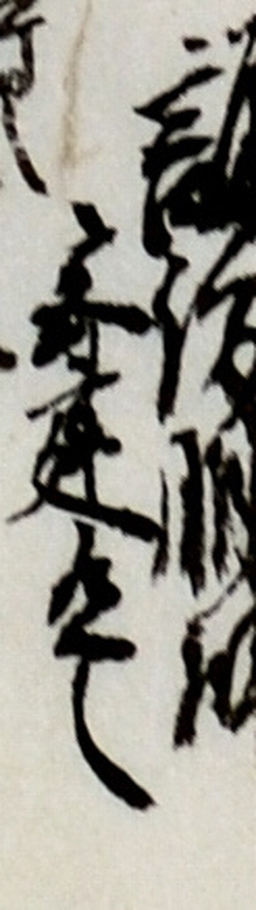堂建有之
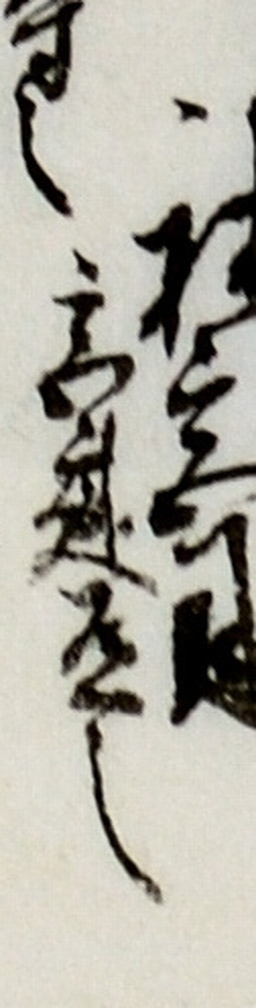宮建有之
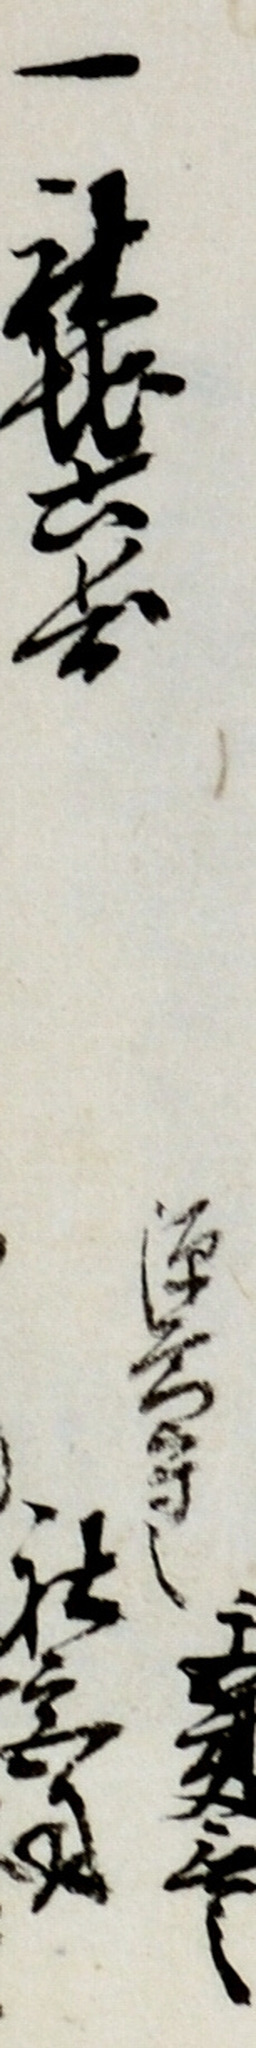一社地六歩社宮司
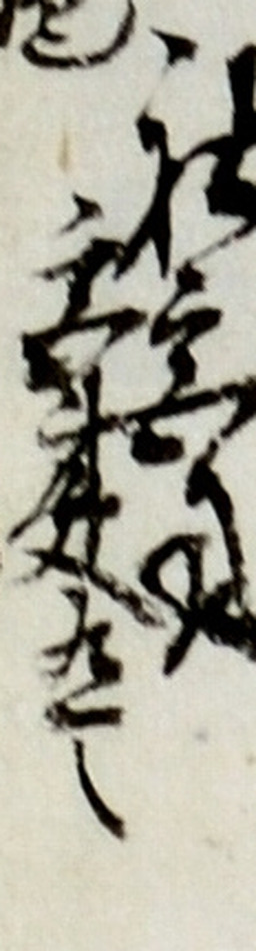堂建有之
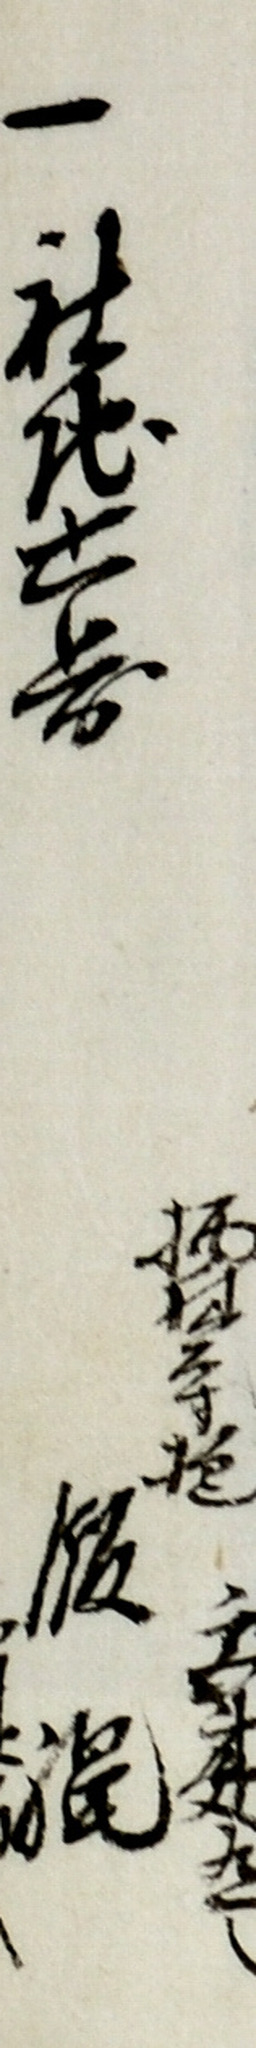一社地六歩飯縄
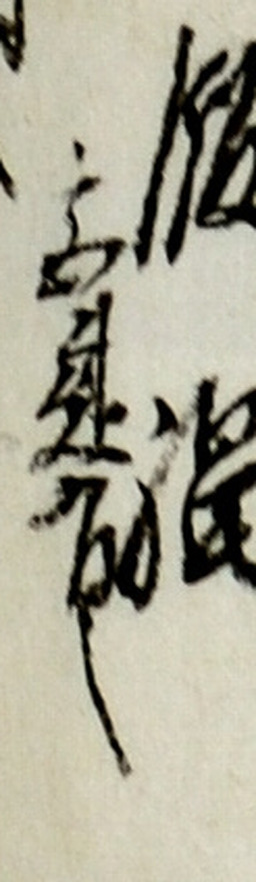堂建有之
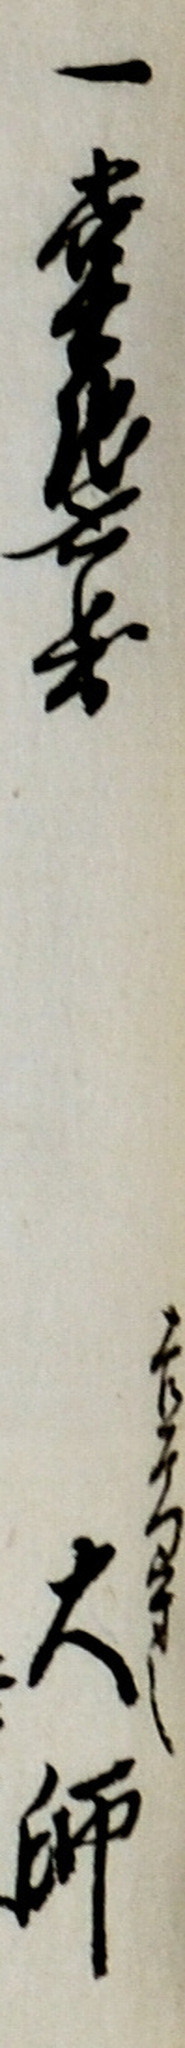一堂地六歩大師
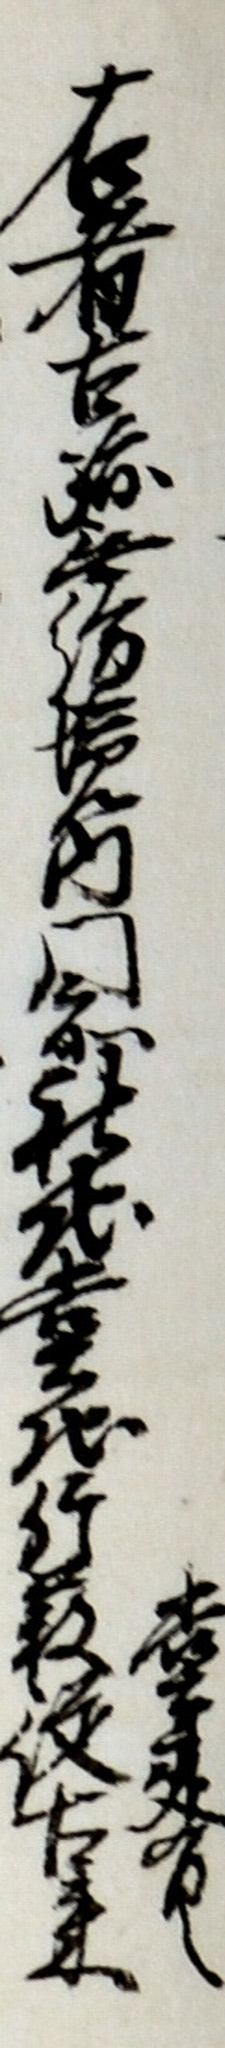右者古跡無粉境内門前社地堂地竹藪従古来
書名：御領分中山林社地手控
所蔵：伊那市立高遠町図書館・合同会社AMANE
